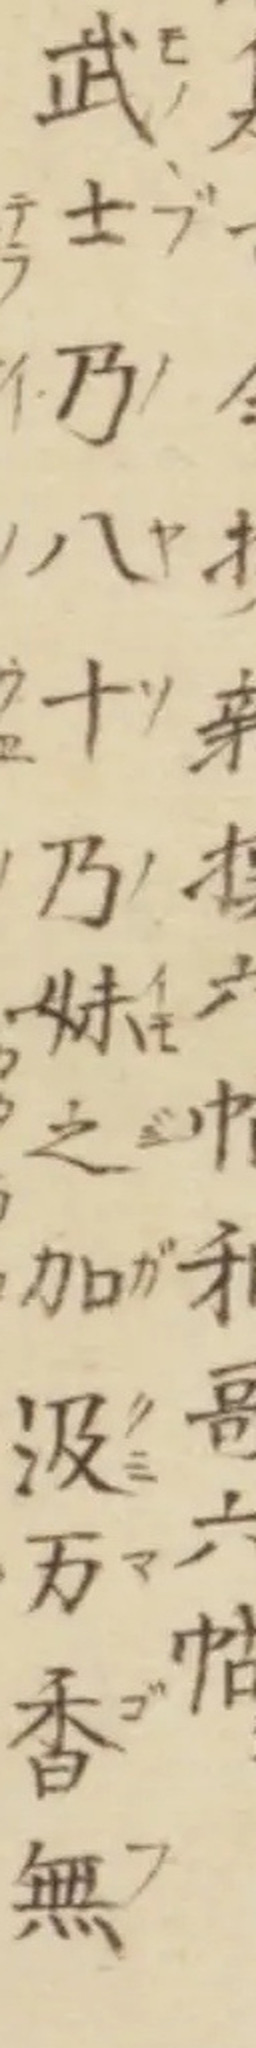武士乃八十乃妹之汲万香無
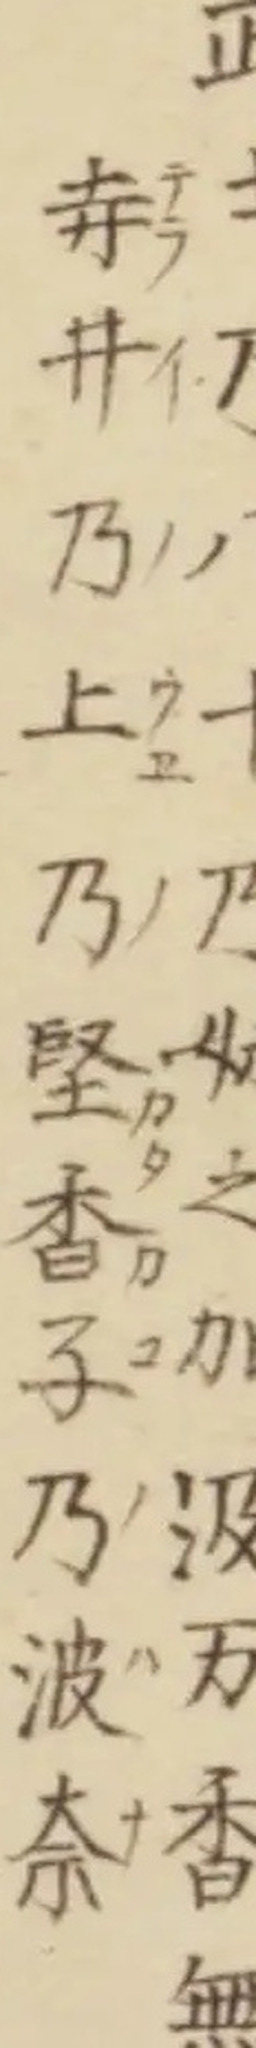寺井乃上乃堅香子乃波奈
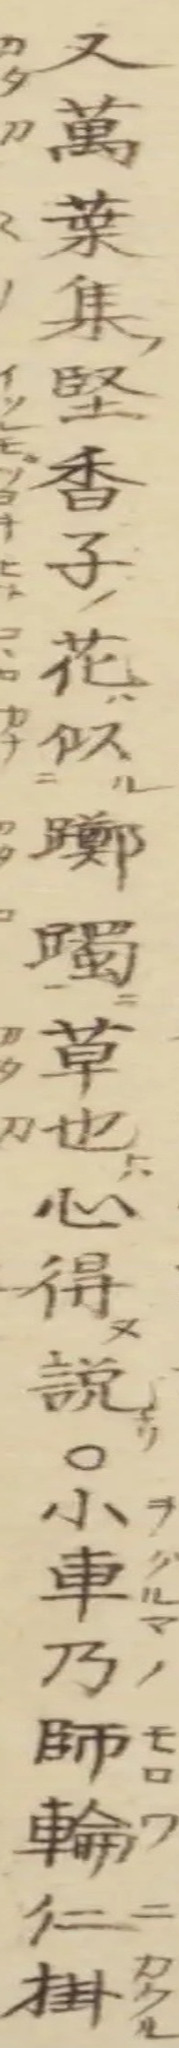又萬葉集ノ堅香子ノ花ハ似ル躑躅ニ草也心得ヌ説〇小車乃師輪仁掛
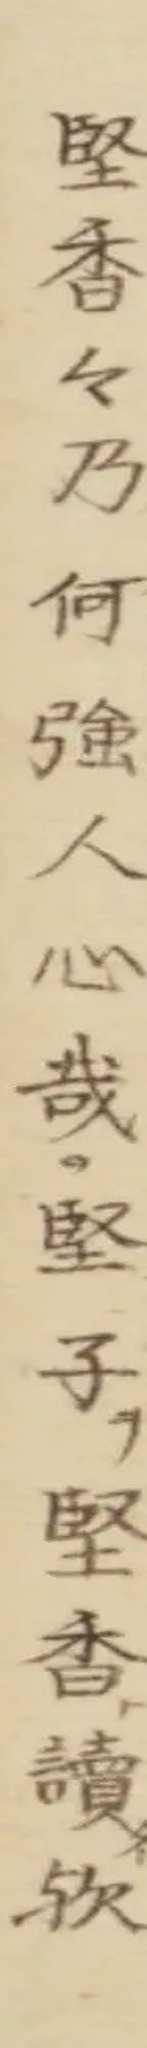堅香々乃何強人心哉○堅子堅香読歟

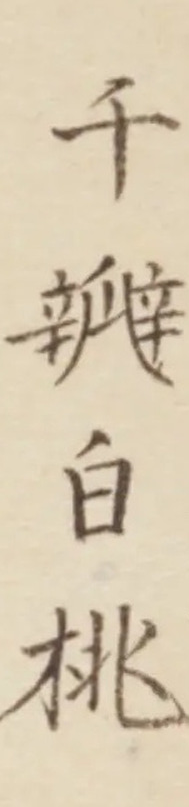千瓣白桃
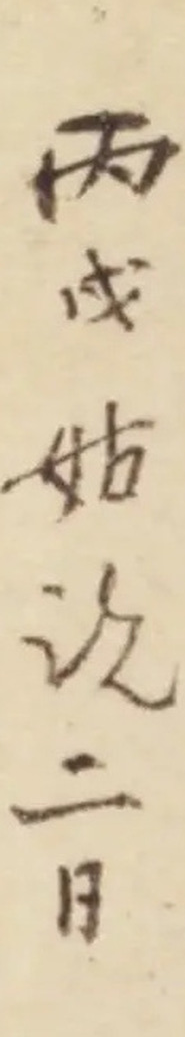丙戌姑洗二日
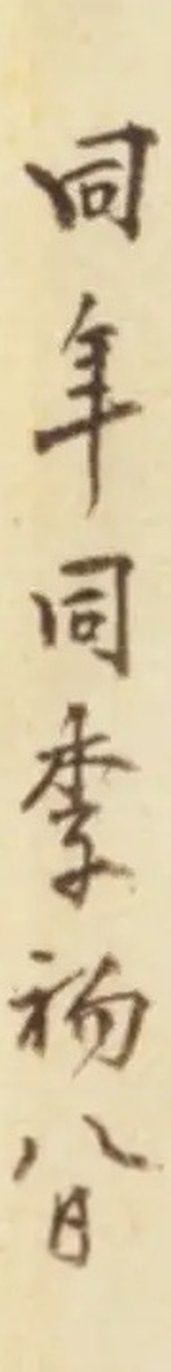同年同季初八日

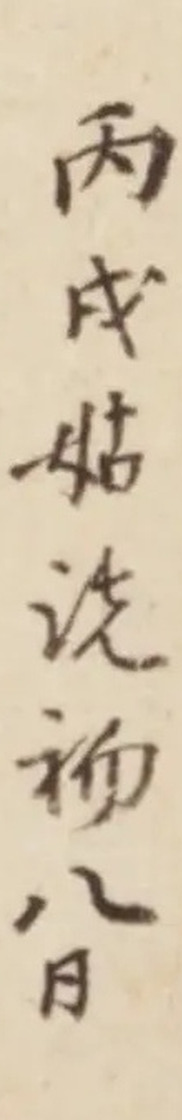丙戌姑洗初八日
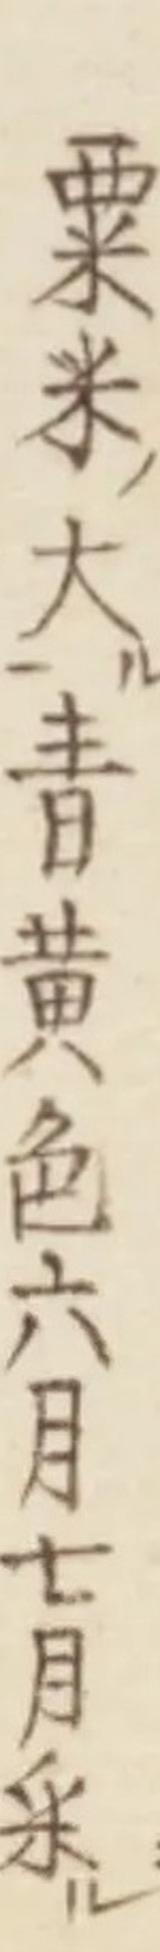粟米の大る青黄色六月七月采る
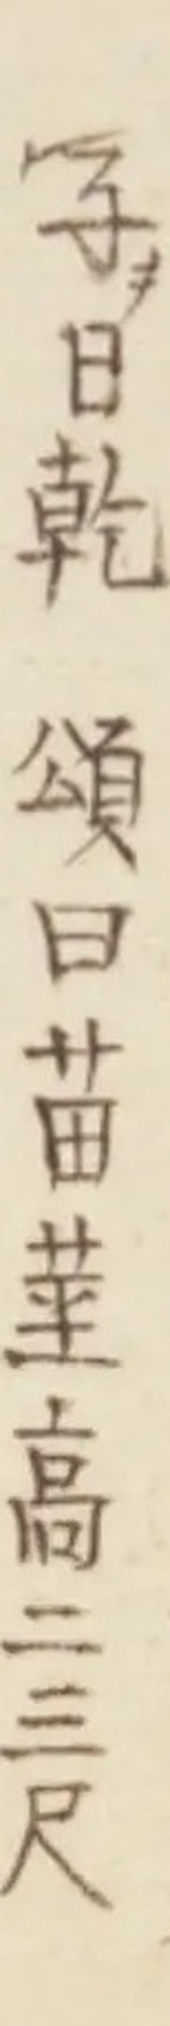子を日乾頌曰苗茎二三尺
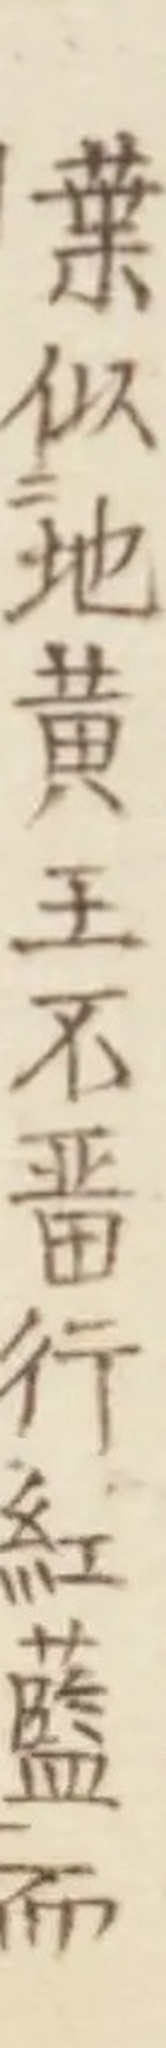葉似て地黄王不晋紅藍而
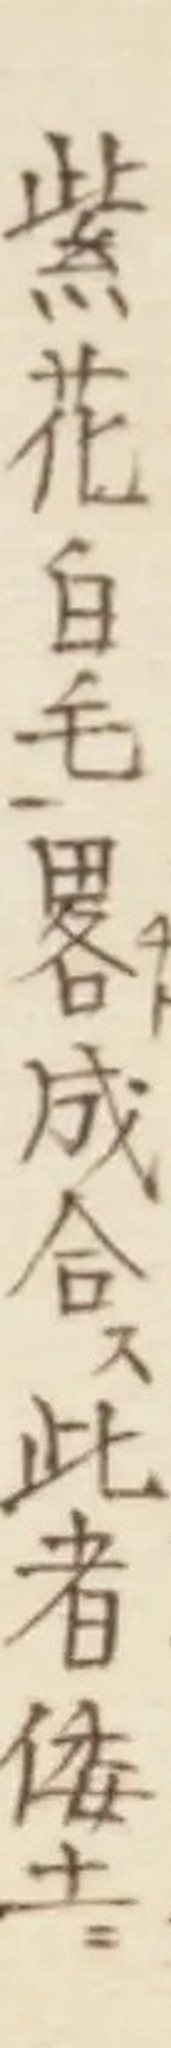紫花白毛畧ちと成合す此者倭土に

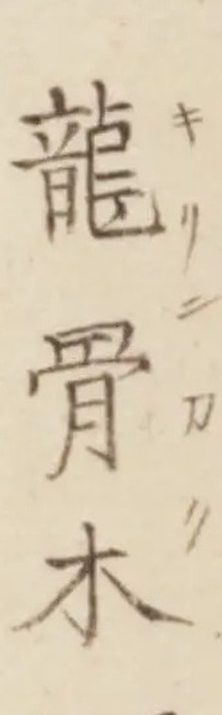龍骨木
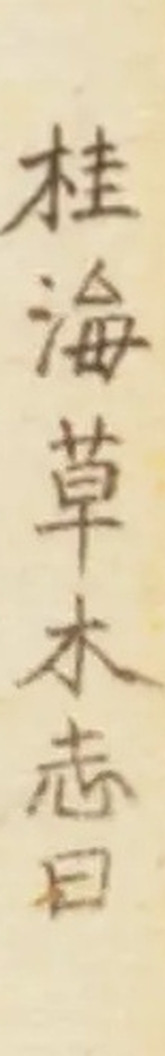桂海草木志曰
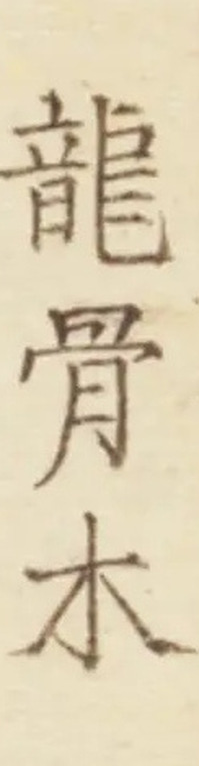龍骨木
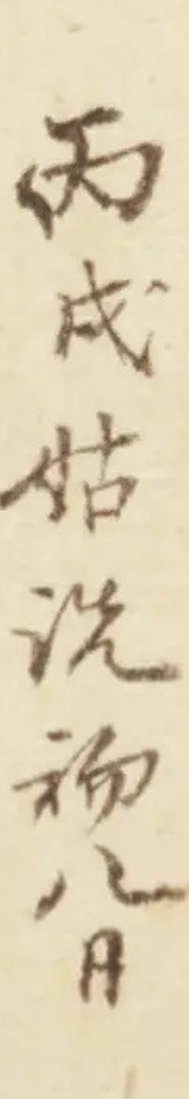丙戌姑洗初八日
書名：梅園草木花譜春之部. 3
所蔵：国立国会図書館 National Diet Library, JAPAN
